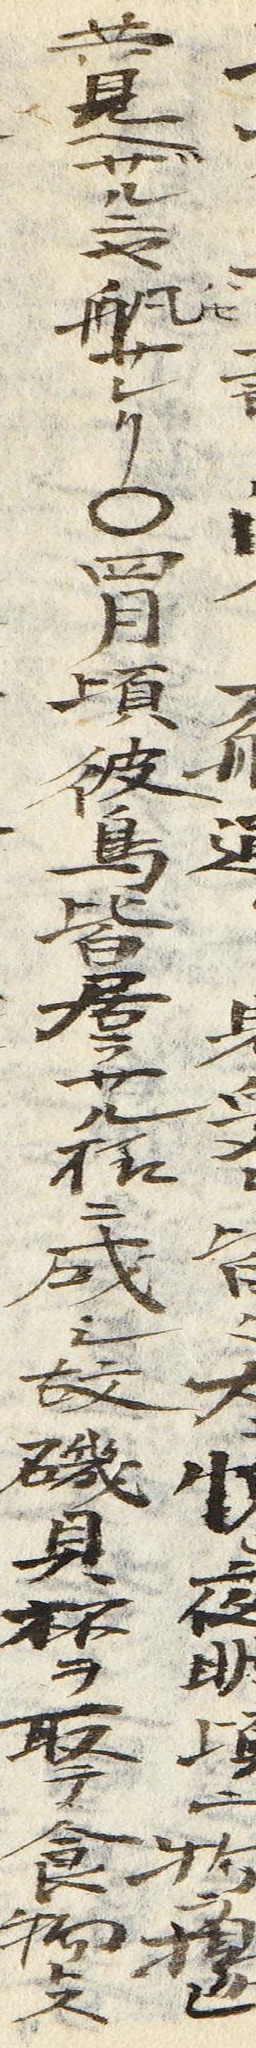共見へザルニヤ帆サレク〇四月頃彼鳥皆居ラサル様ニ成シ故磯貝抔ヲ取テ食物トス
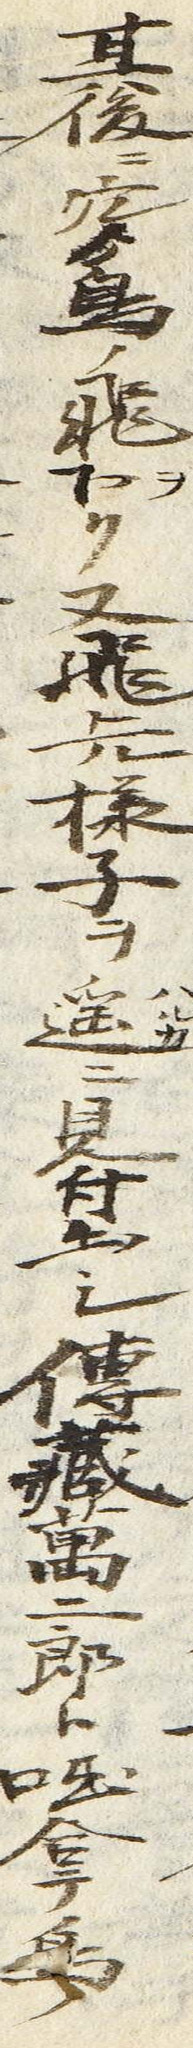其後ニ穴ゟ鳥ノ飛下リ又飛上ル様子ヲ遥ニ見付出シ傳蔵萬二郎ト咄合テ鳥ノ
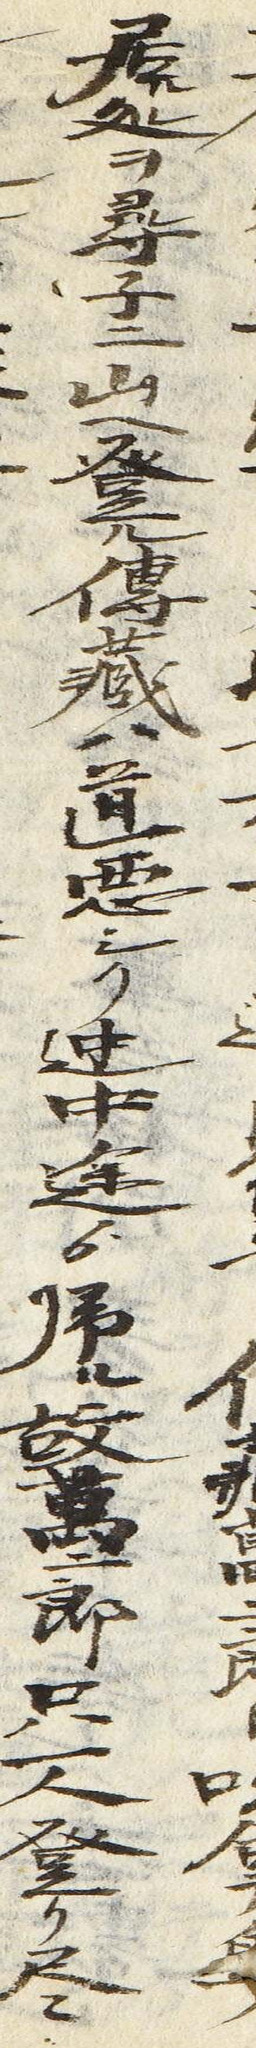居ル処ヲ尋ネ二山ヘ登ル傳蔵ハ道悪シク迚中途ゟ帰ル故萬二郎只一人登リ尽
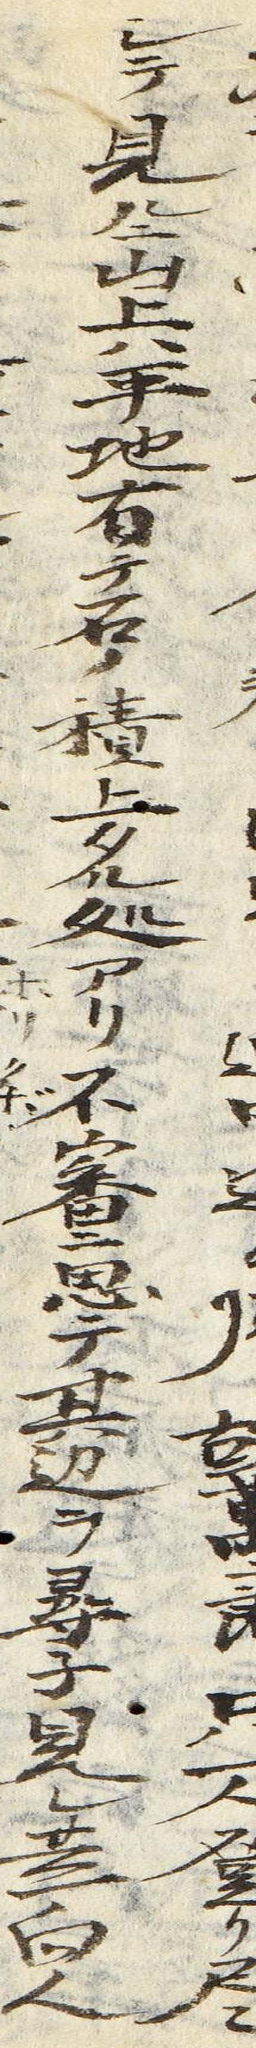シテ見ルニ山上ハ平地有テ石ノ積上タル処アリ不審ニ思テ其辺ヲ尋ネ見レ共一向人
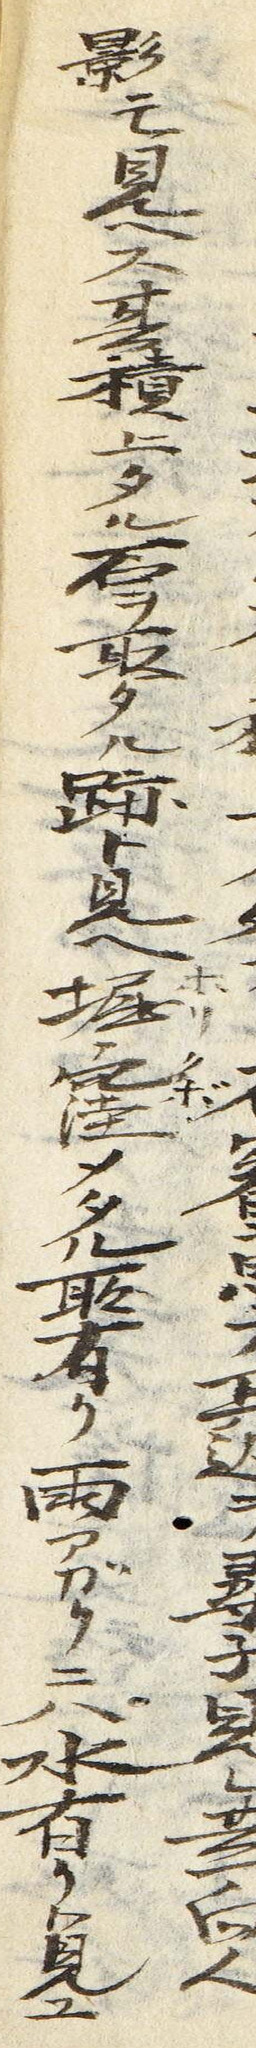影モ見へス其積上タル石ヲ取タル跡ト見ヘ堀窪メタル所有リ雨アガリニハ水有リト見ユ

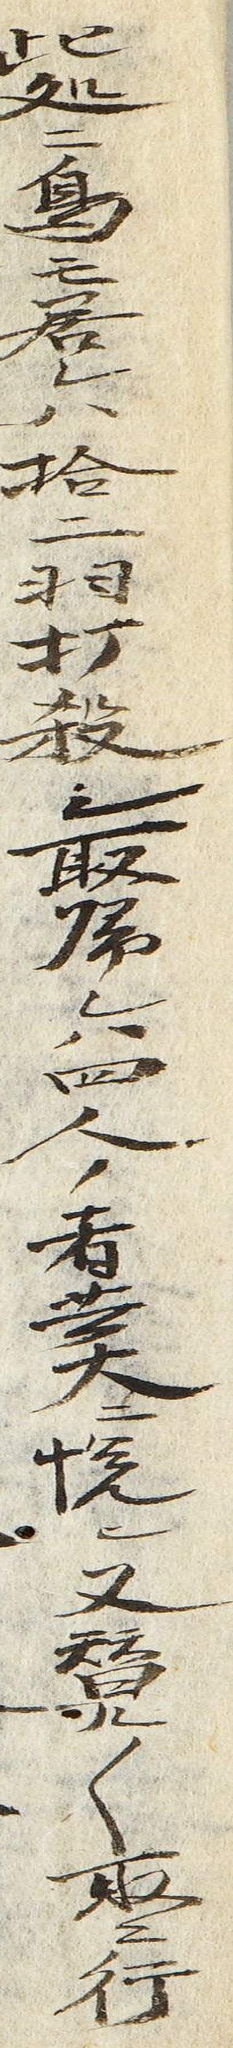此処ニ鳥モ居レハ拾二羽打殺シ取帰レハ四人ノ者共大ニ悦ヒ又替ル〳〵取ニ行
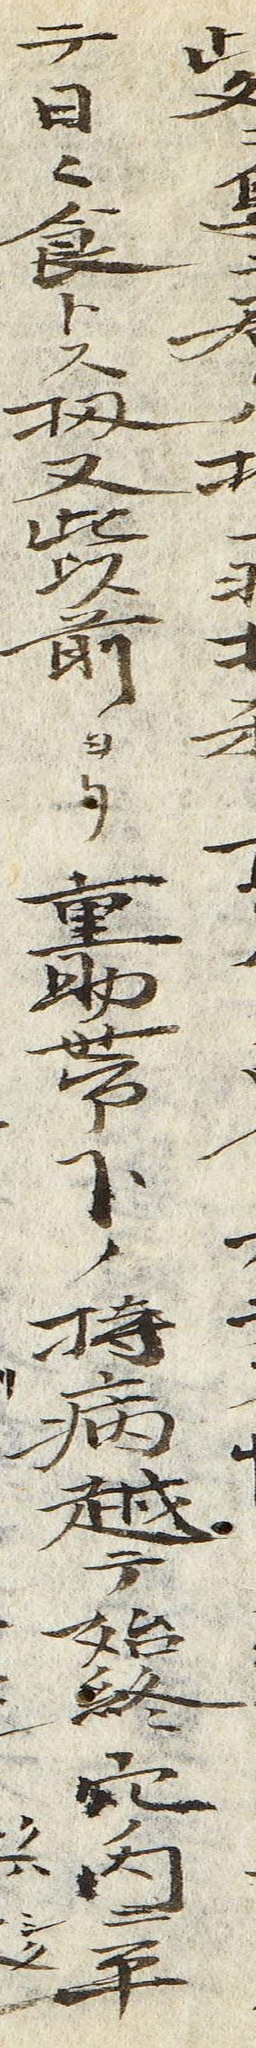テ日々食トス扨又此以前ヨリ重助帯下ノ持病越テ始終穴ノ内ニ平
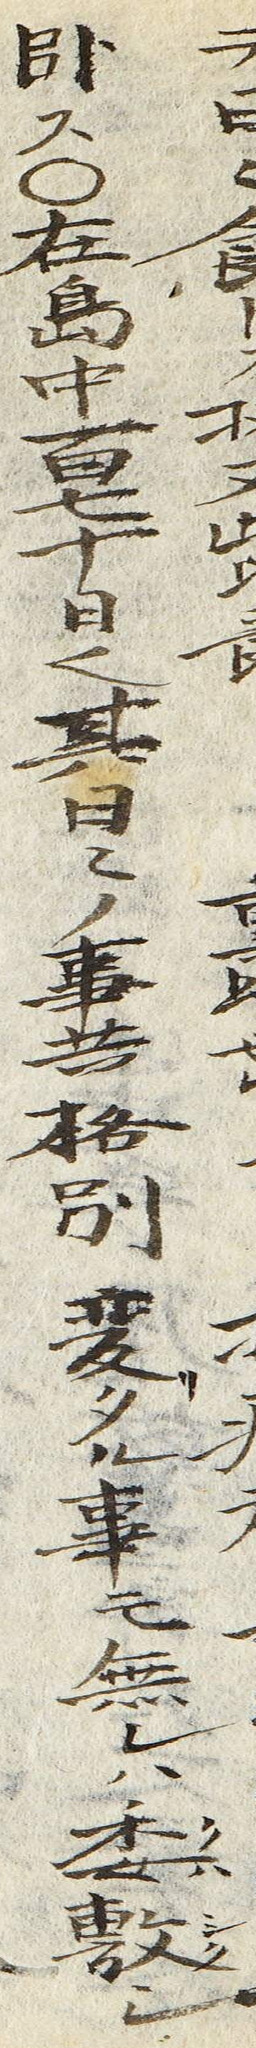臥ス〇在島中百七十日也其日々ノ事共格別変タル事モ無レハ委敷シ
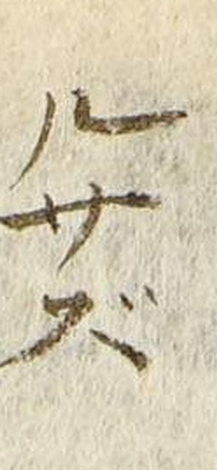ルサズ
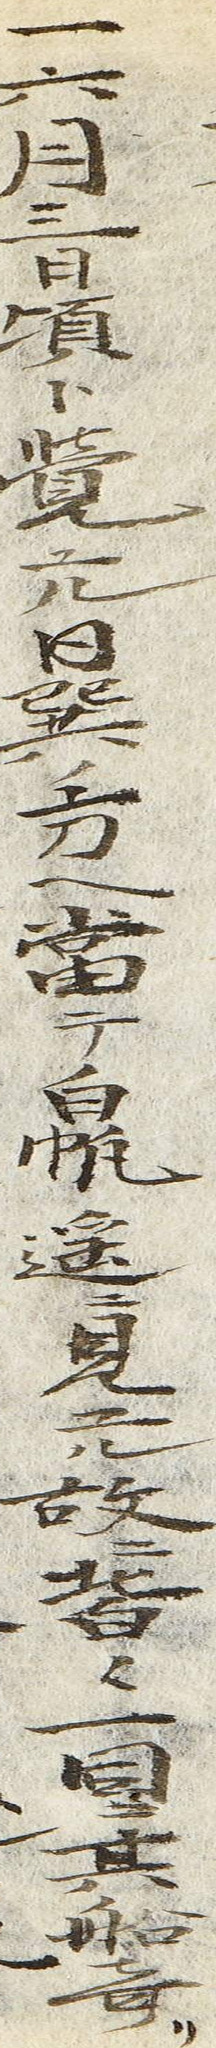一六月三日頃ト覚ユル日巽ノ方へ当テ白帆遥ニ見ユル故ニ皆々一同ニ其船寄リ
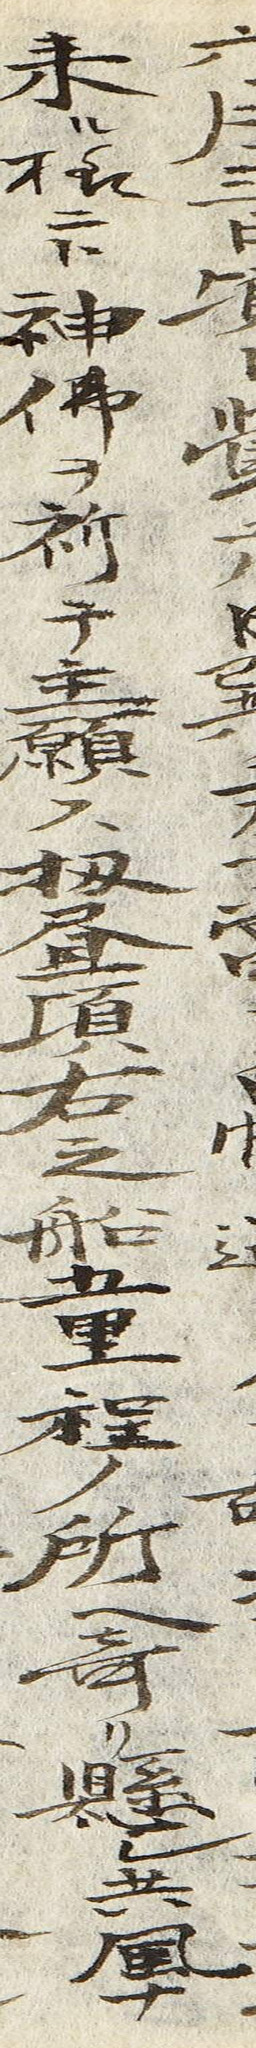来ル様ニト神仏ヲ祈テ主願ス扨昼頃右之船五里程ノ所へ寄リ懸シ共風ナ
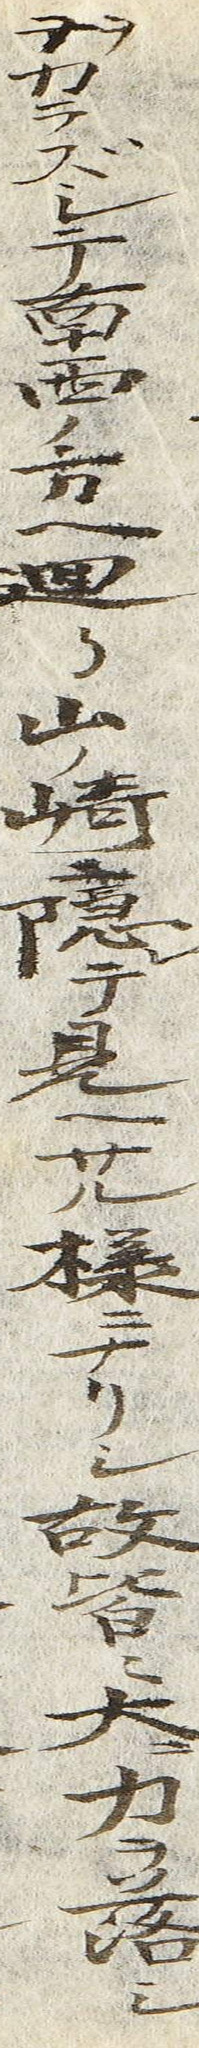カラズシテ南西ノ方ヘ廻リ山ノ崎エ隠テ見ヘサル様ニナリシ故皆々大ニ力ヲ落シ
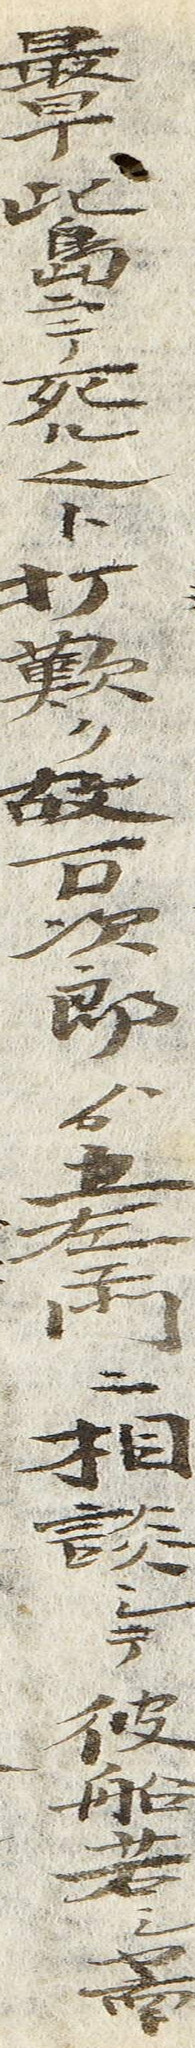最早此島ニテ死ル也ト打歎ク故万次郎ゟ五左衛門ニ相談シテ彼船若シヤ南
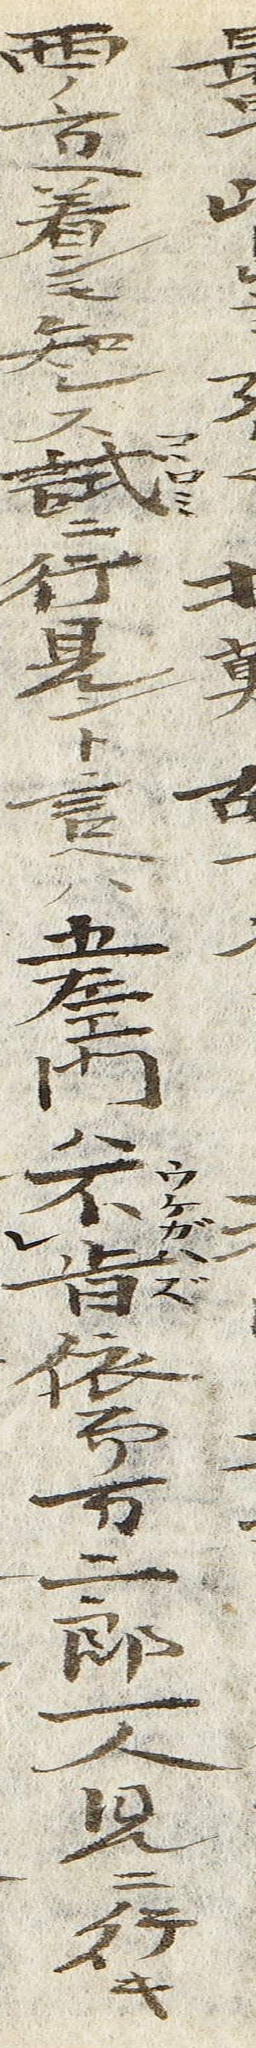西ノ方ヘ着シモ知レス試ニ行見ント言ヘハ五左衛門ハ不肯依而万次郎一人見ニ行キ
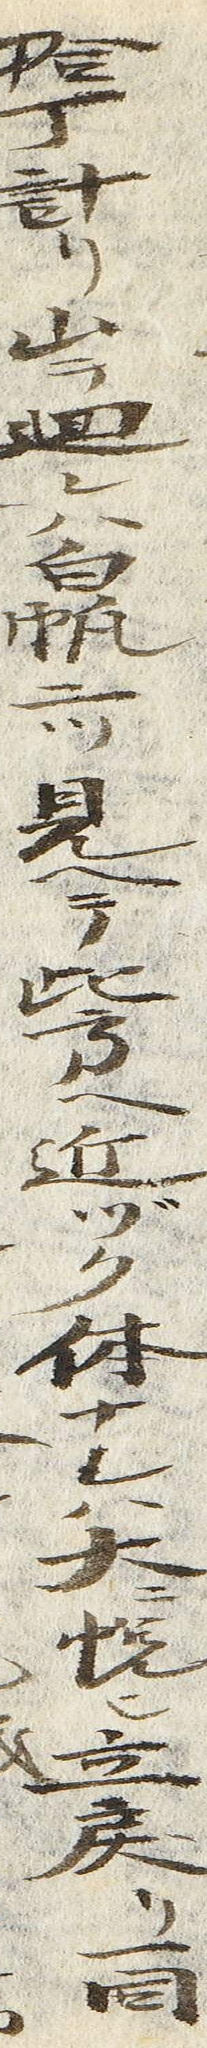拾丁計リ山ヲ廻レハ白帆二ツ見ヘテ此方ヘ近ヅク体ナレハ大ニ悦ヒ立戻リ一同
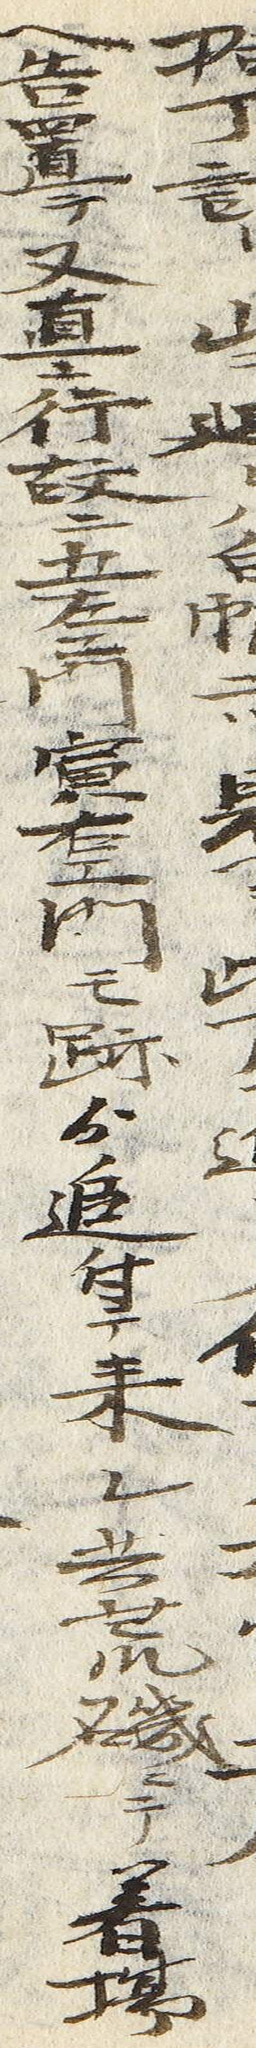ヘ告置テ又直ニ行故ニ五左衛門寅右衛門モ跡ゟ追付テ来レ共荒磯ニテ着場
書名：漂流記聞
